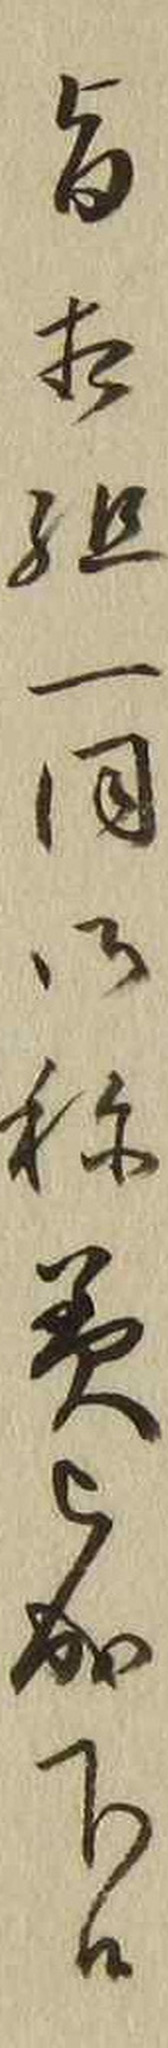旨相組一同御称美被成下候
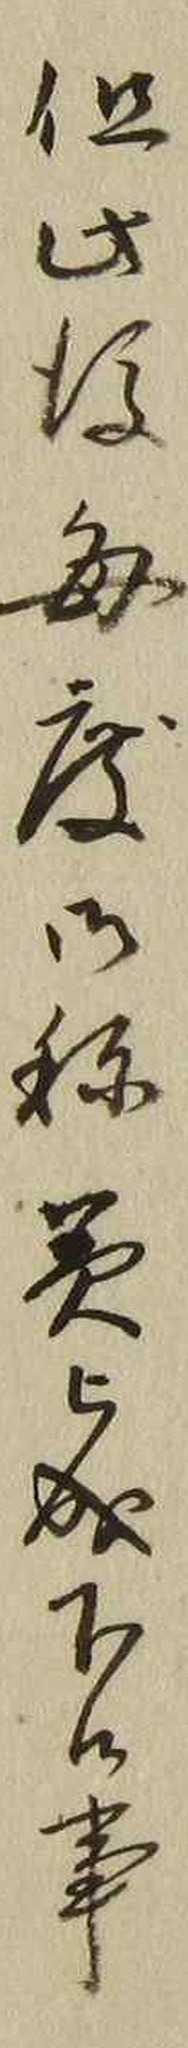但此後毎度御称美被成下候事
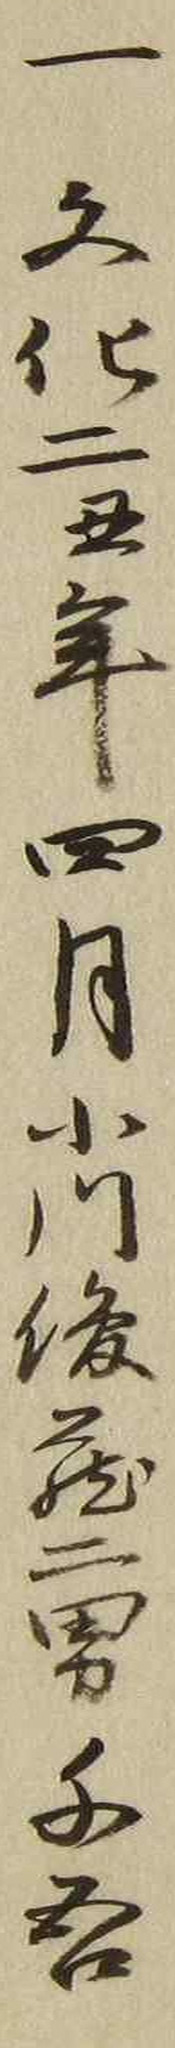一文化二丑年四月小川俊蔵二男千吾
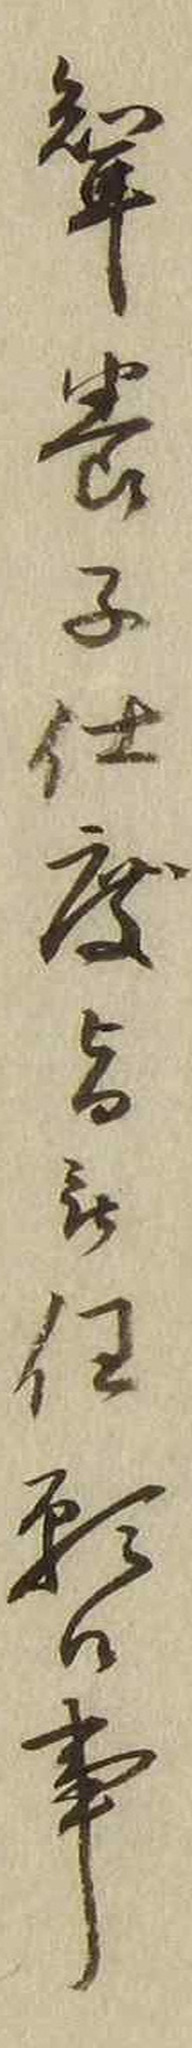婿養子仕度旨被任願候事
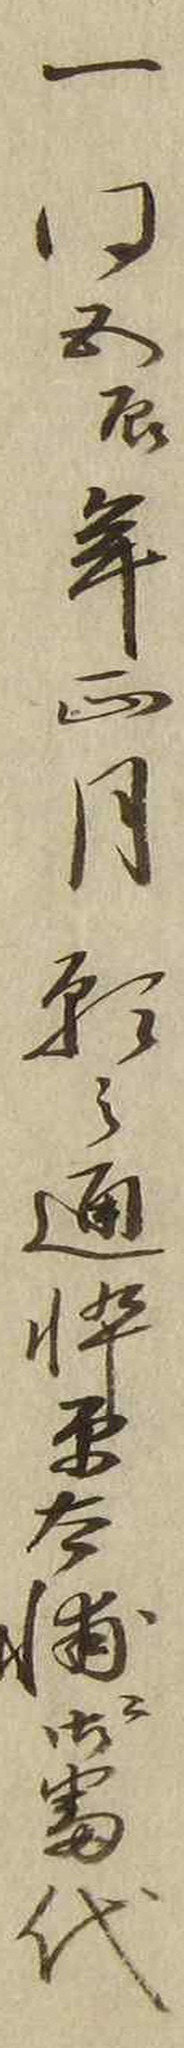一同五辰年正月願之通忰原太輔ニ御番代

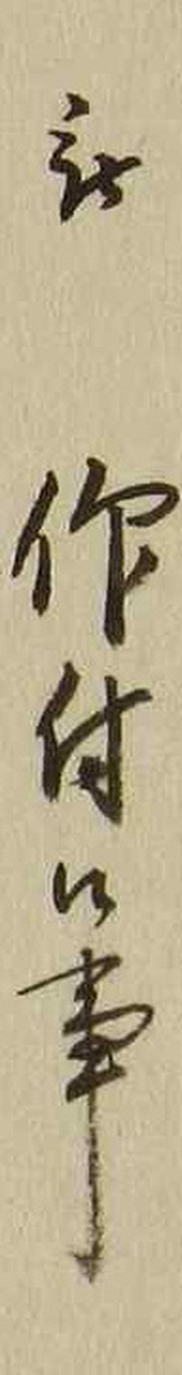被仰付候事
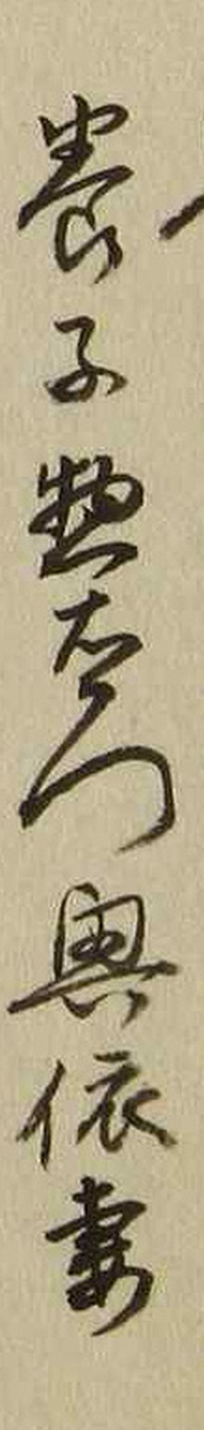養子惣右衛門興依妻
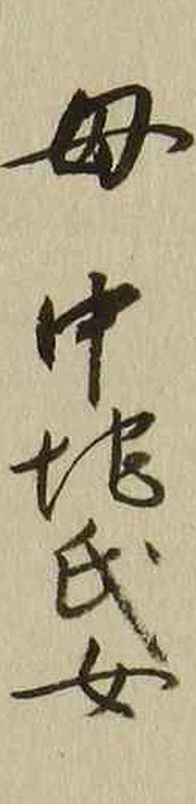母中地氏女
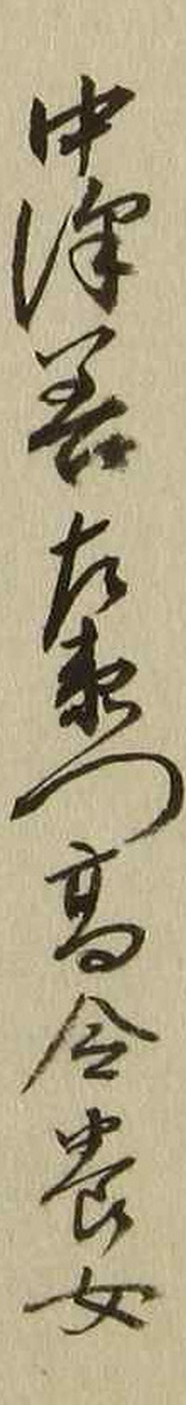中澤善左衛門高令養女
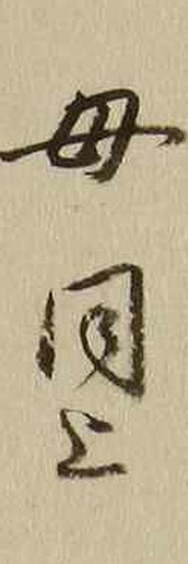母同上
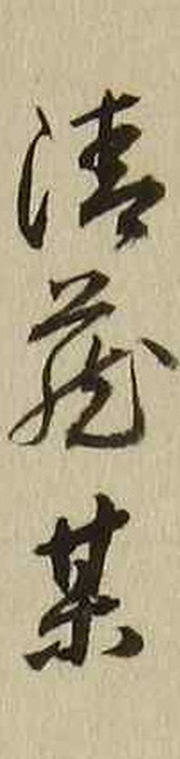清蔵某
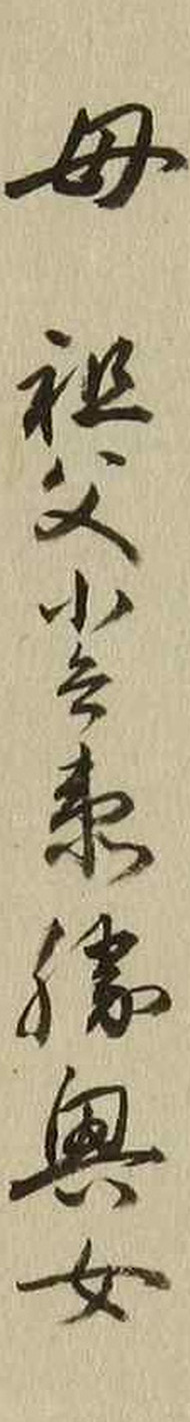母祖父小兵衛勝興女
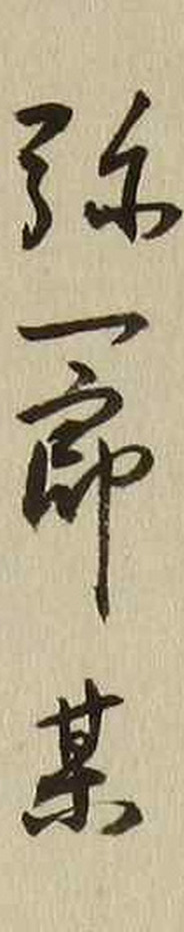弥一郎某
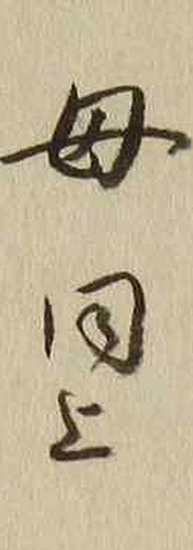母同上
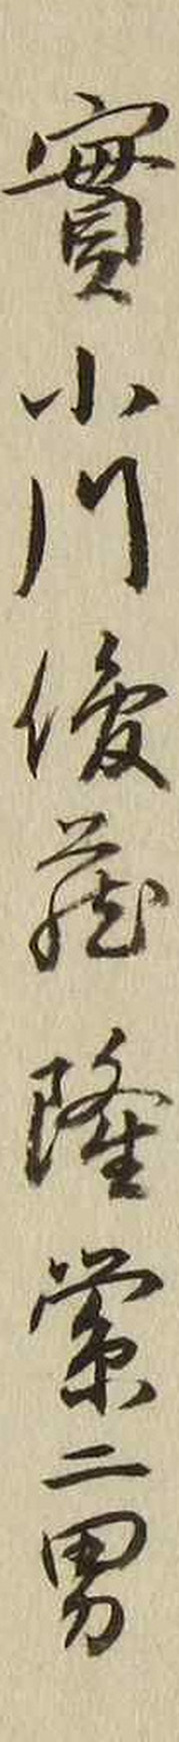実小川俊蔵隆業二男
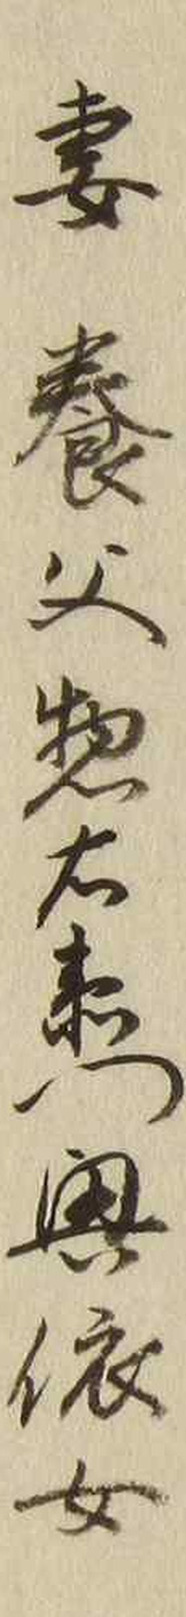妻養父惣右衛門興依女
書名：諸士系譜　巻之128　た之部4
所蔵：会津若松市立会津図書館
